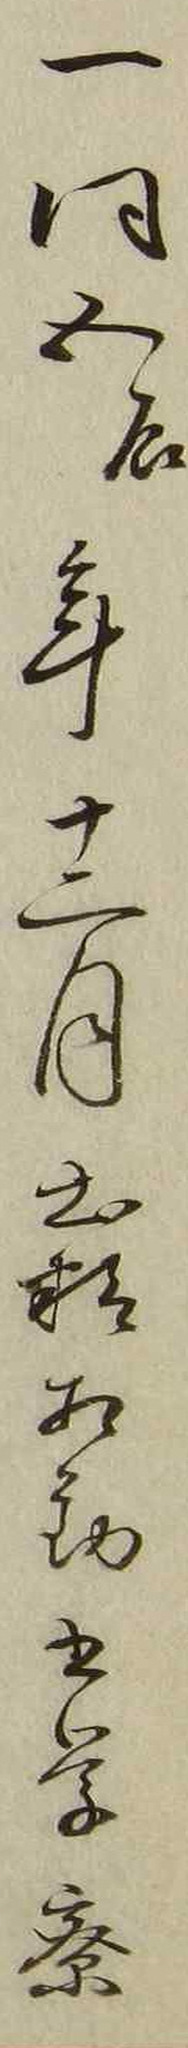一同五辰年十二月出精相勤書学寮
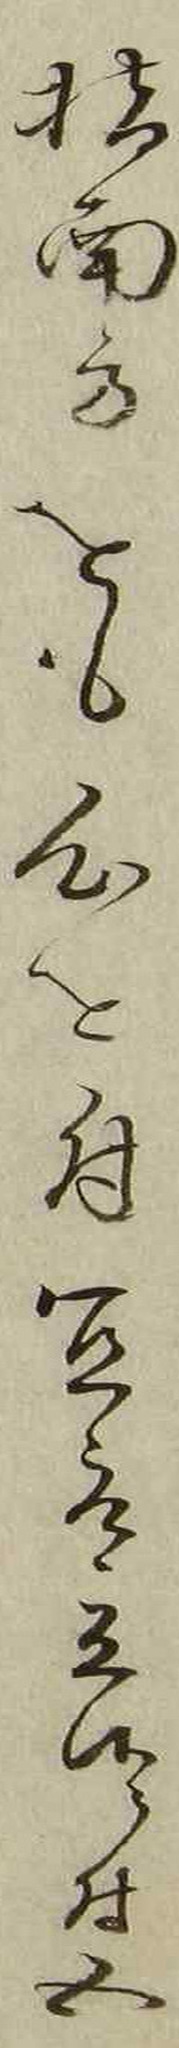指南方をも心を付宜取立候ニ付五
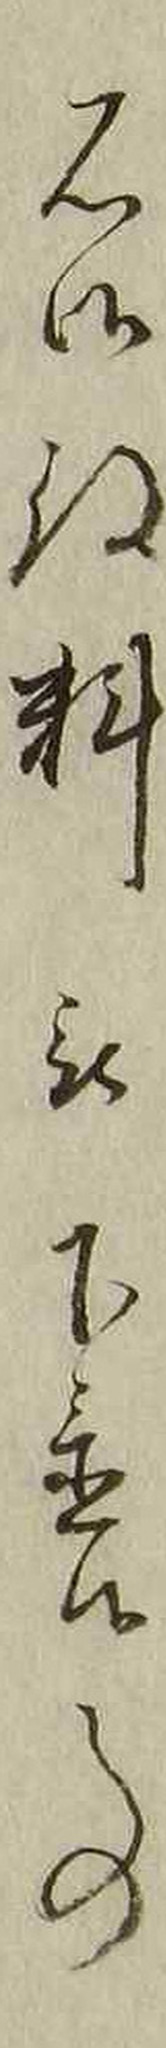石御役料被下置候事
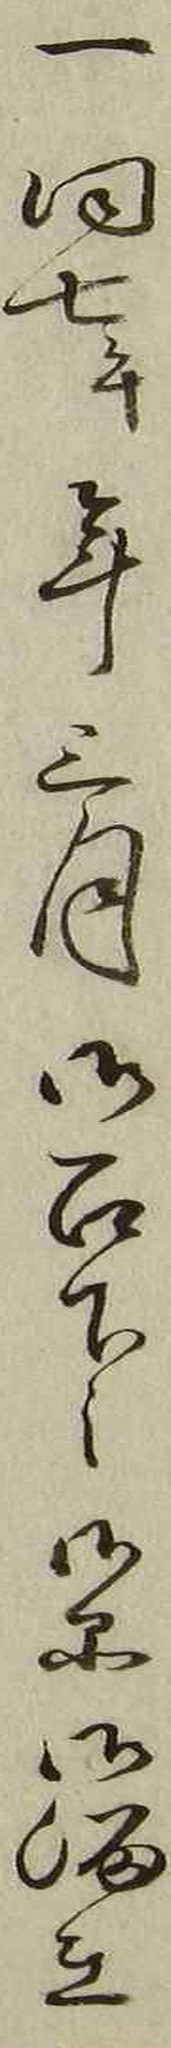一同七午年三月御召下之御品御溜在
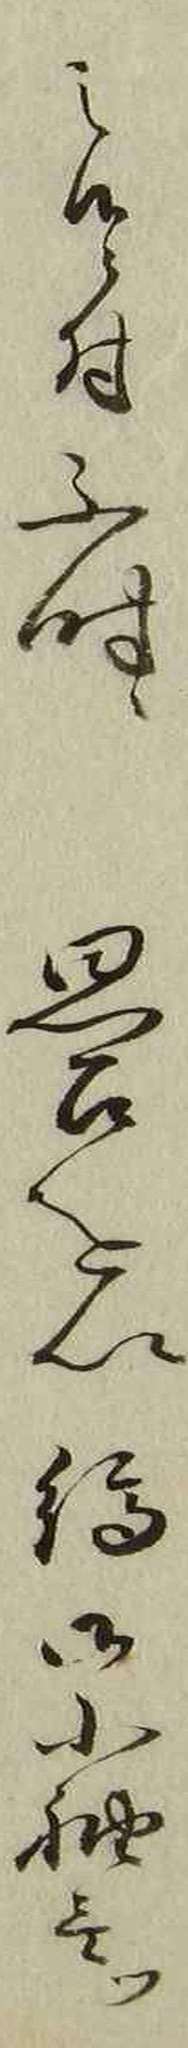之候ニ付不時ニ思召を以縞御小袖壱ツ
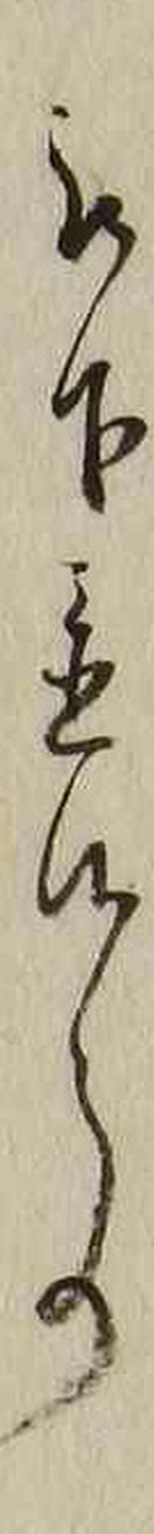被下置候事
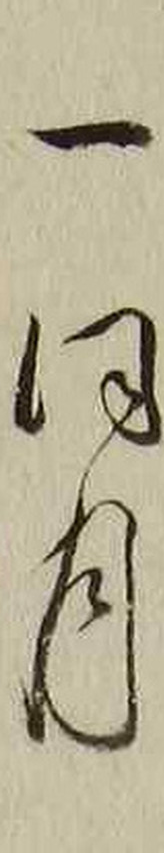一同月
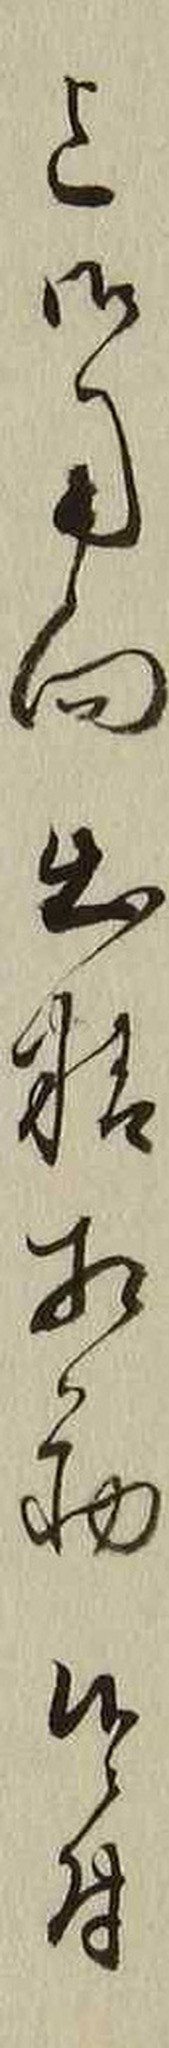迄御用向出精相勤候ニ付
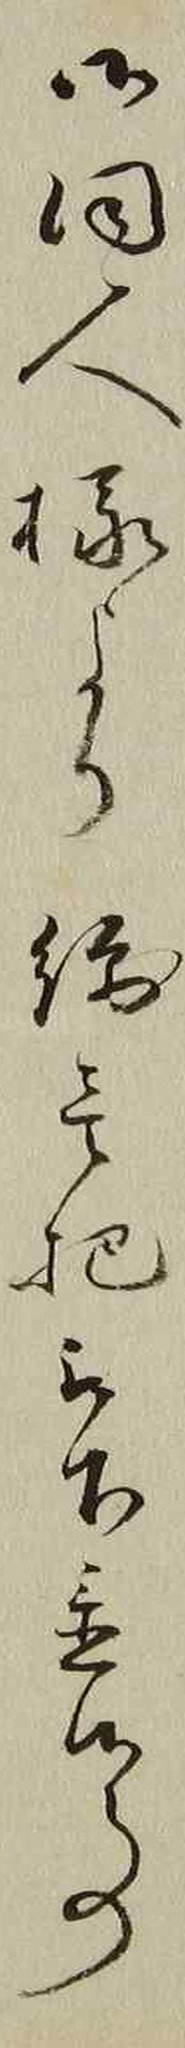御同人様より綿壱把被下置候事
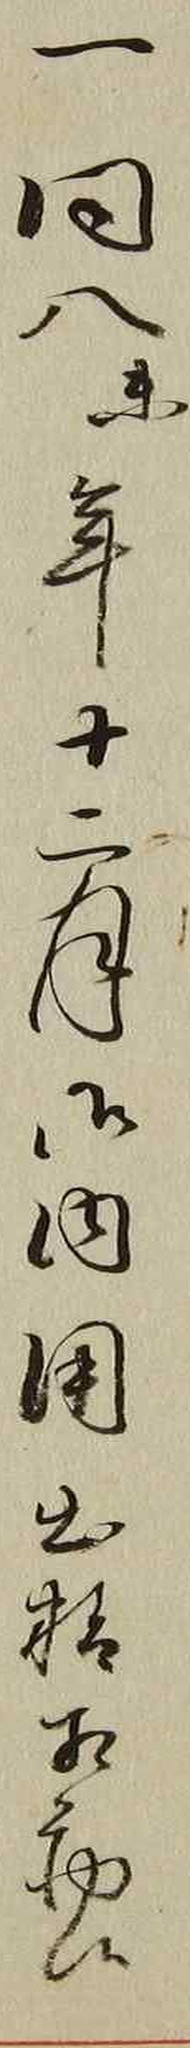一同八未年十二月御内用出精相勤候
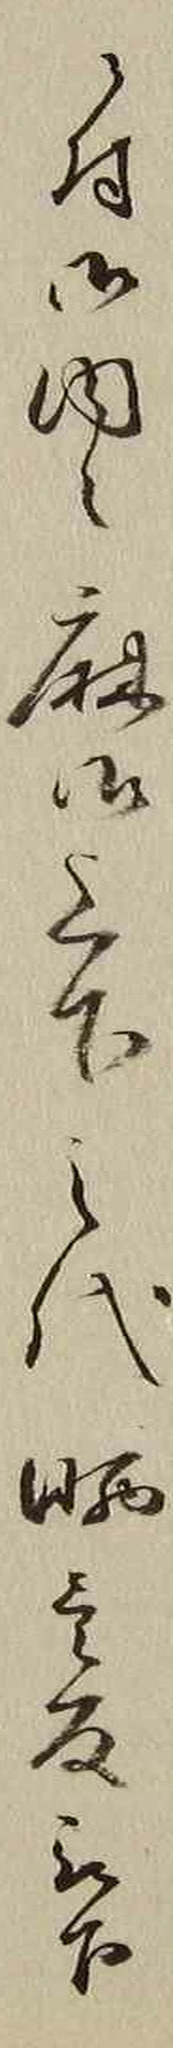ニ付御内々麻御上下之代晒壱反被下
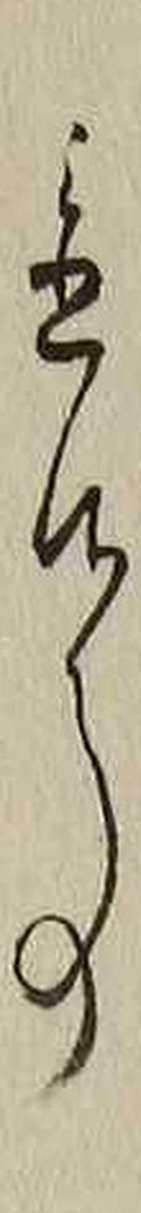置候事
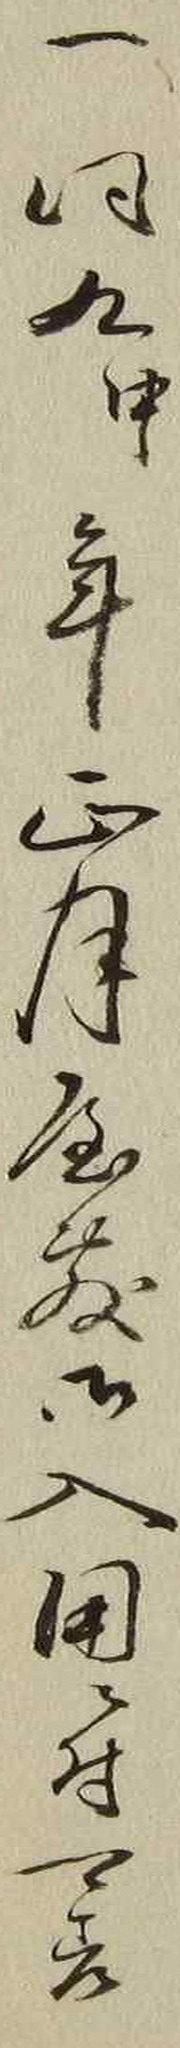一同九申年正月屋敷御入用ニ付可差
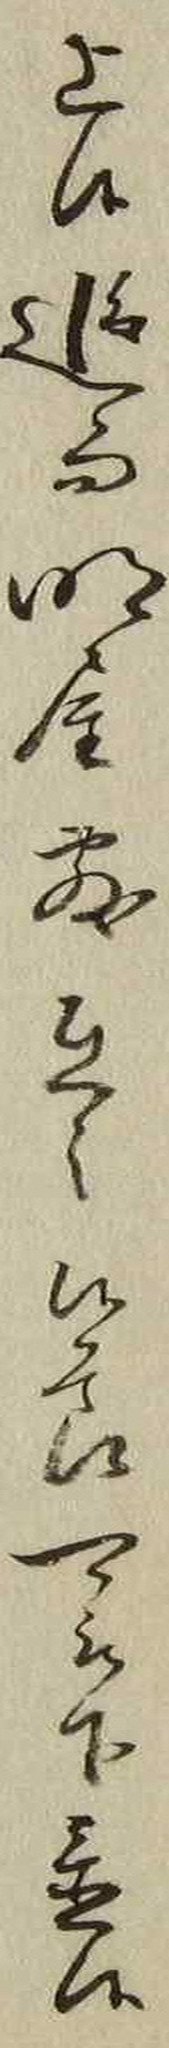上候追而明屋敷在之候節可被下置候
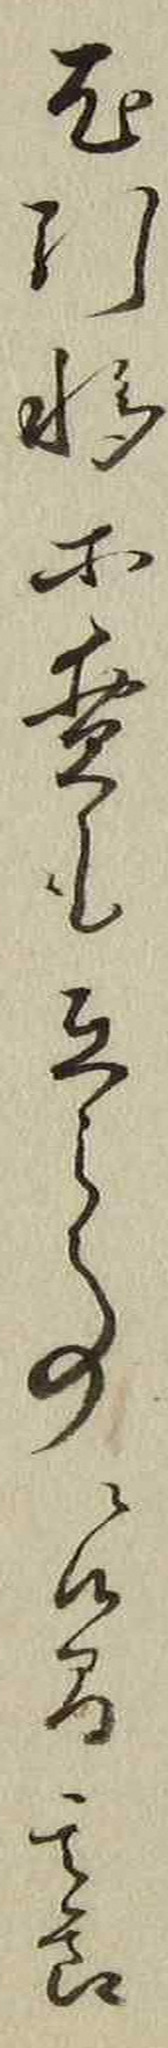尤引移等費も在之事ニ候間其節
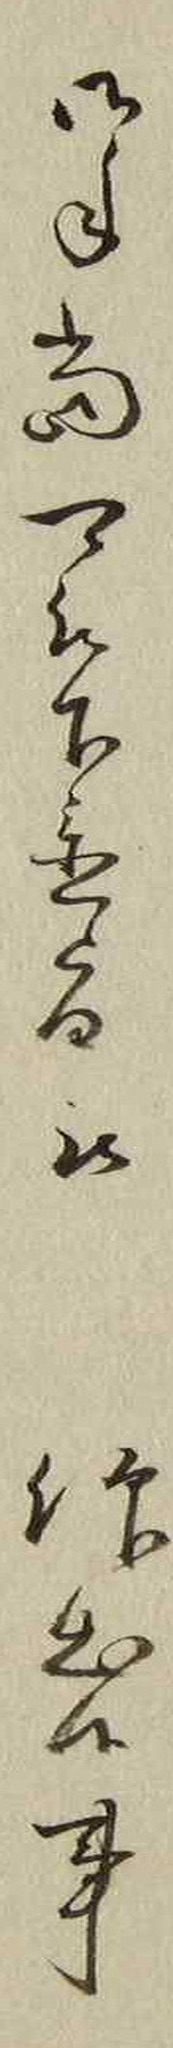御手当可被下置旨被仰出候事
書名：諸士系譜　巻之4　い之部4
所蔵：会津若松市立会津図書館
